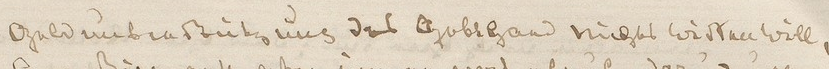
Geldunterstützung des Gotthard nichts wissen will,
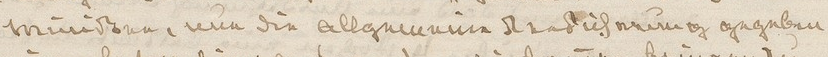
Minister, nur die allgemeine Versicherung gegeben
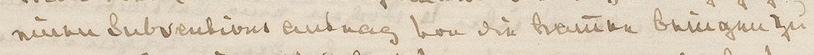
einen Subventionsantrag vor die Kammer bringen zu
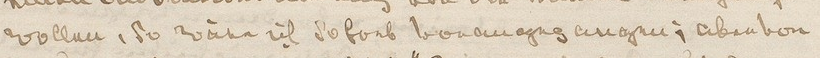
wollen, so wäre ich sofort vorangegangen; aber von
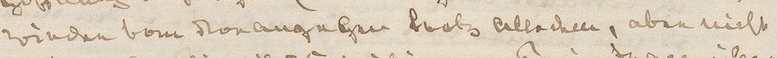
wieder vom Vorangehen trotz Alledem, aber nicht
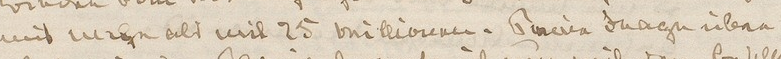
mit mehr als mit 25 Millionen. Seine Frage über
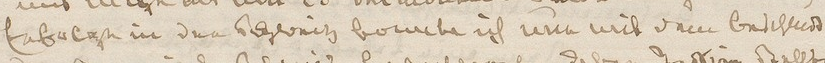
Erfolge in der Schweiz konnte ich nur mit dem Beschluß
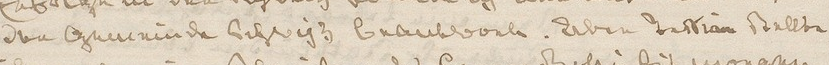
der Gemeinde Schwyz beantworten. Aber Tessin stellte
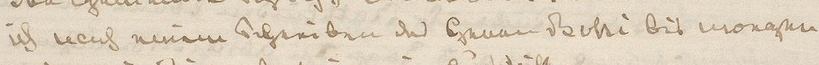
ich nach einem Schreiben des Herrn Bossi bis morgen
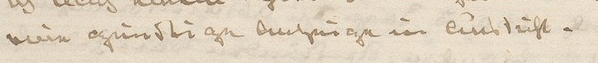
eine günstige Anzeige in Aussicht.
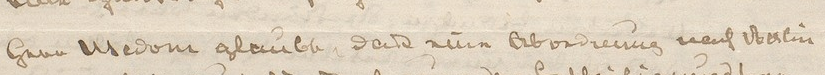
Herr Usedom glaubt, daß eine Abordnung nach Berlin
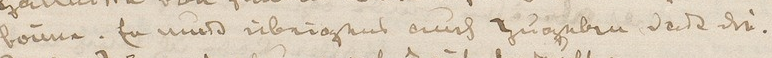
könne. Er muß übrigens auch zugeben daß die
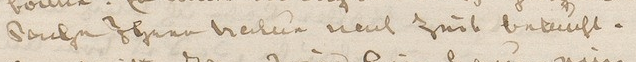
Sache Ihrer Natur nach Zeit braucht.
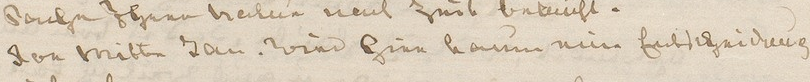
Vor Mitte Jan. wird hier kaum eine Entscheidung
